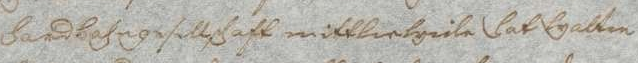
hardbahngesellschaft mittlerweile hat walten
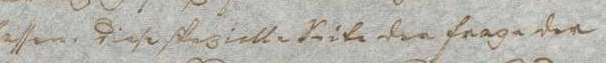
lassen. Diese spezielle Seite der Frage der
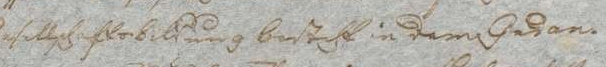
Gesellschaftsbildung besteht in dem Gedan-
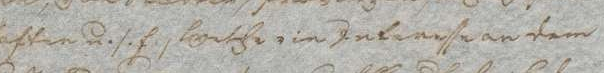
schaften u. s. f., welche ein Interesse an dem
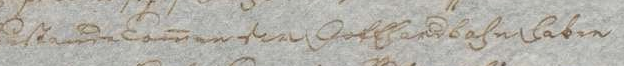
Zustandekommen der Gotthardbahn haben
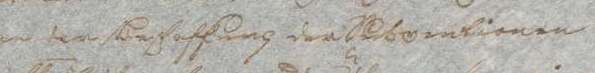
an der Beschaffung der Subventionen
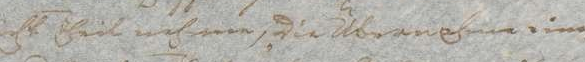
nicht Theil nehmen, die Übernahme eines
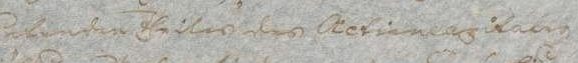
bedeutenden Theiles des Actiencapitales
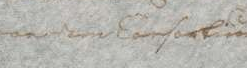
von dem Consortium,
